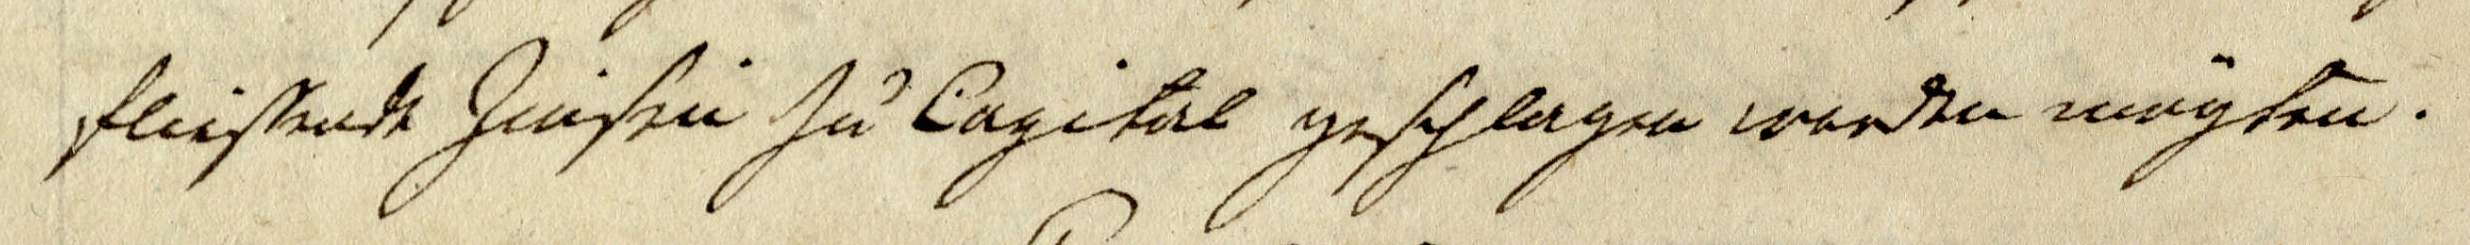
fliessende Zinsen zu Capital geschlagen werden mögten.
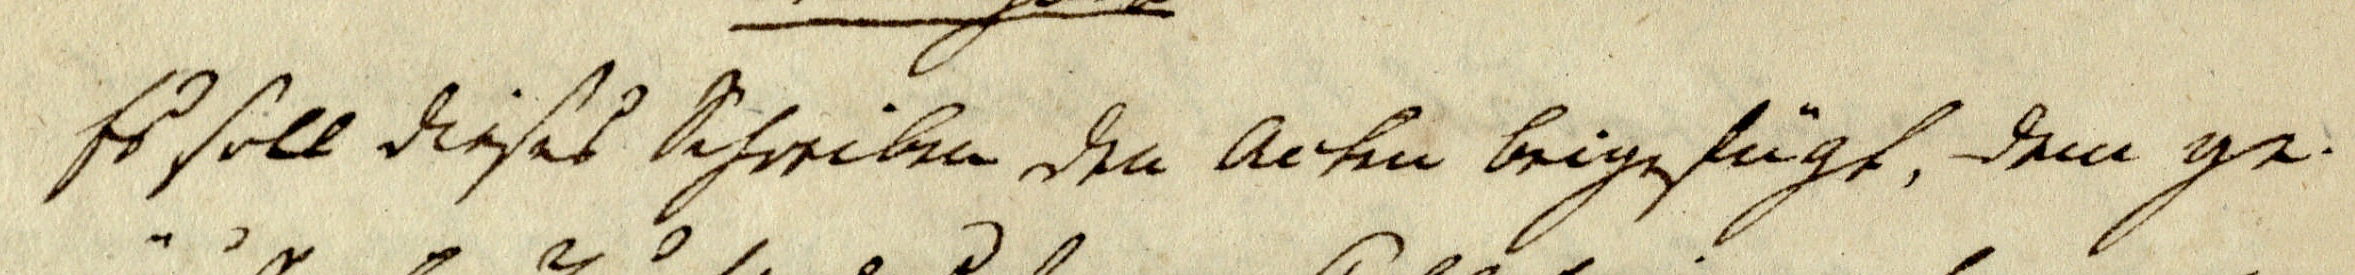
Es soll dieses Schreiben den Acten beigefügt, dem ge¬
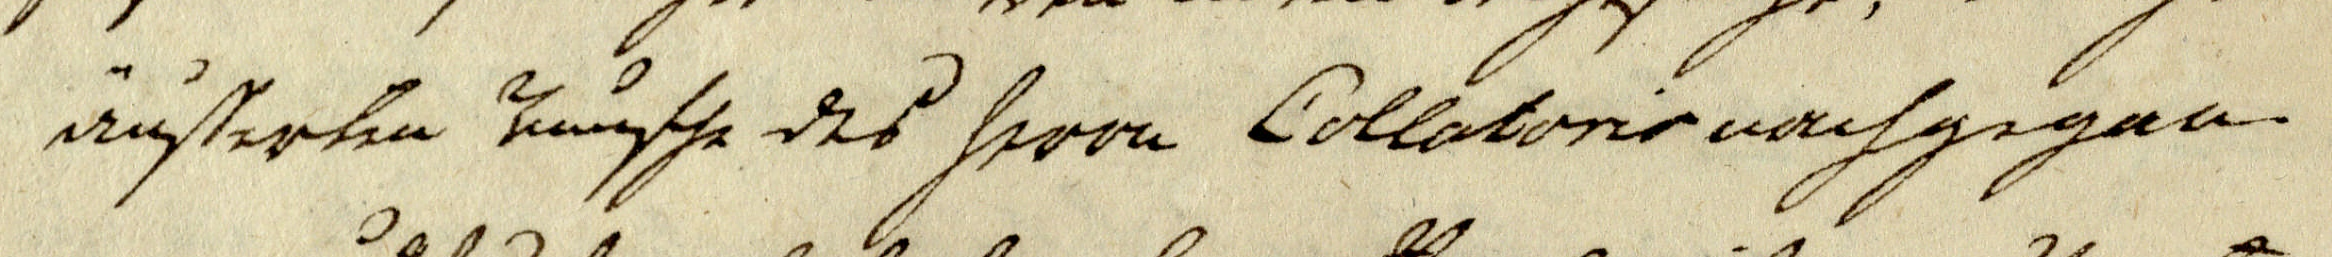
äusserten Wunsche des Herrn Collatoris nachgegan¬
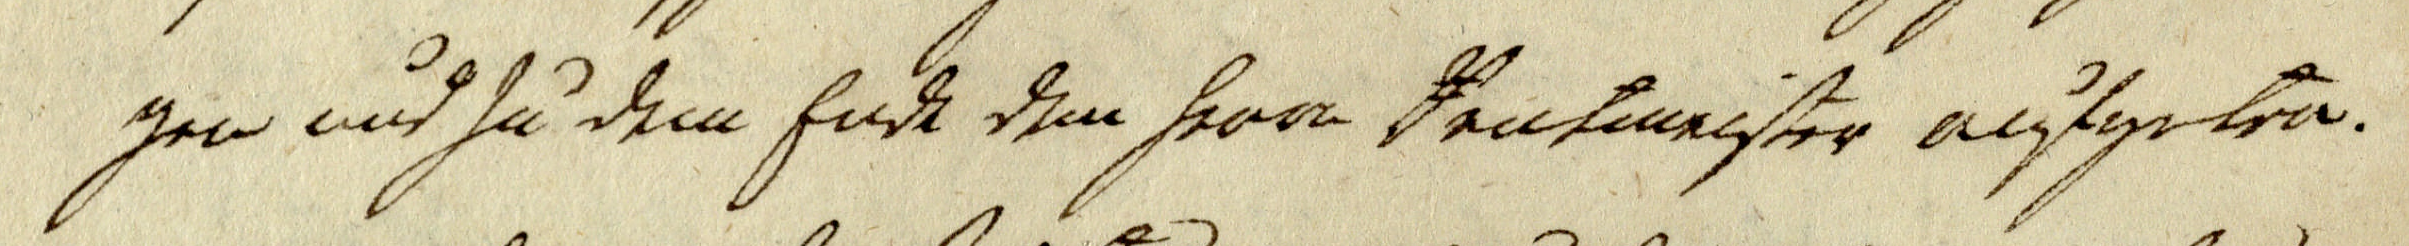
gen und zu dem Ende dem Herrn Rentmeister aufgetra¬
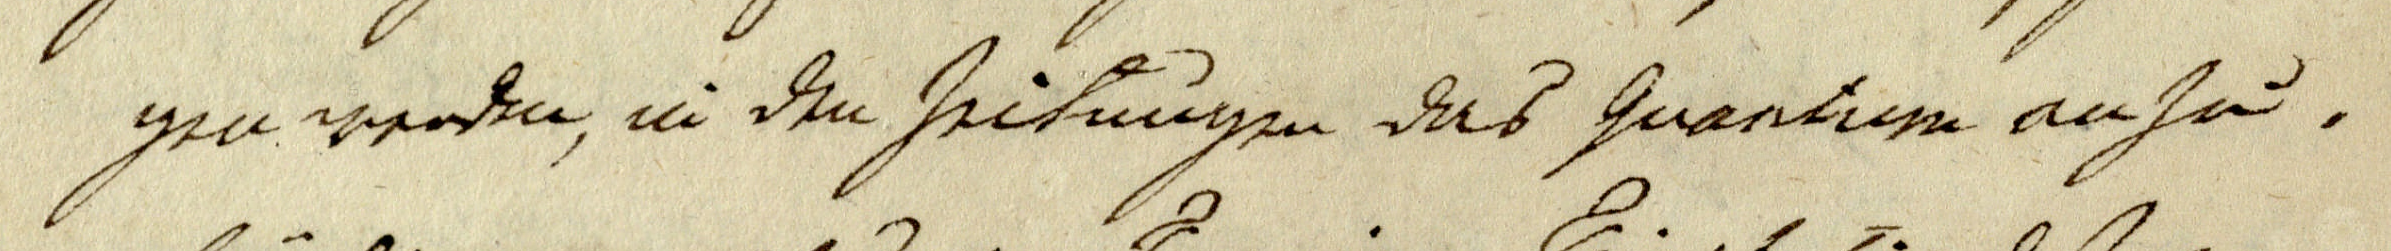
gen werden, in den Zeitungen das Quantum anzu¬
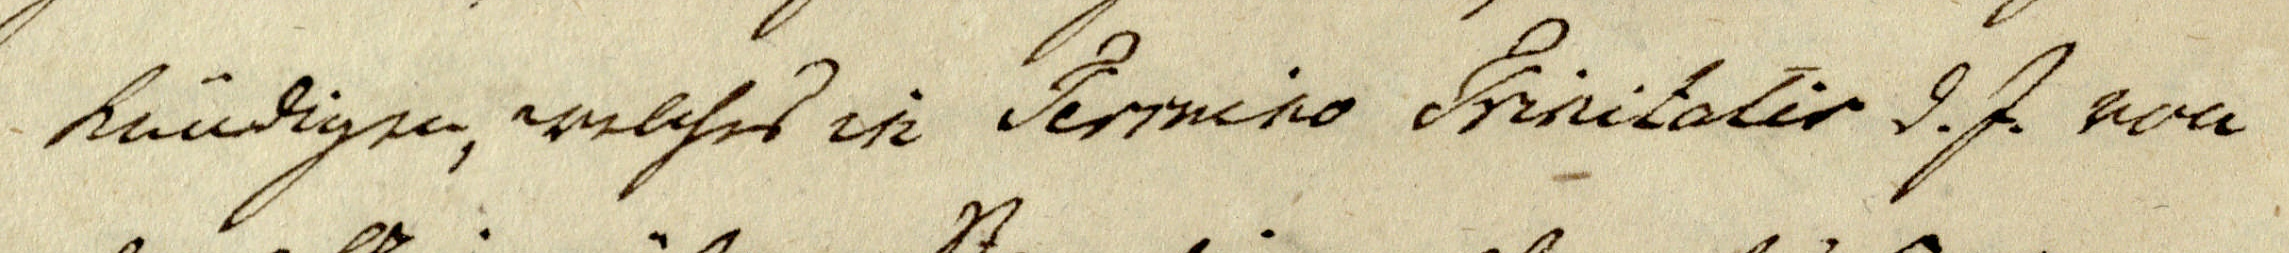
kündigen, welches in Termino Trinitatis d. J. von
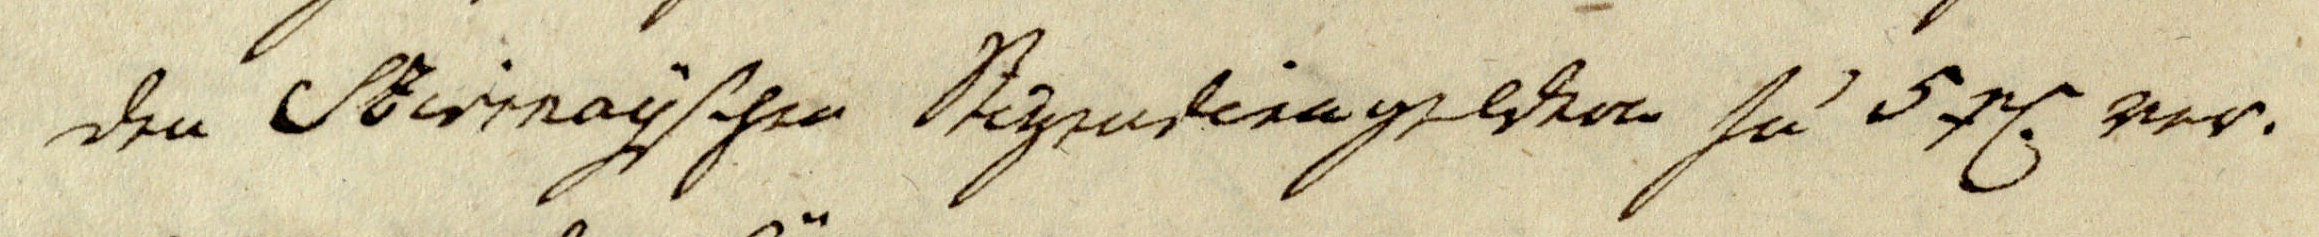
den Szirmaÿschen Stipendiengeldern zu 5 pl. ver¬
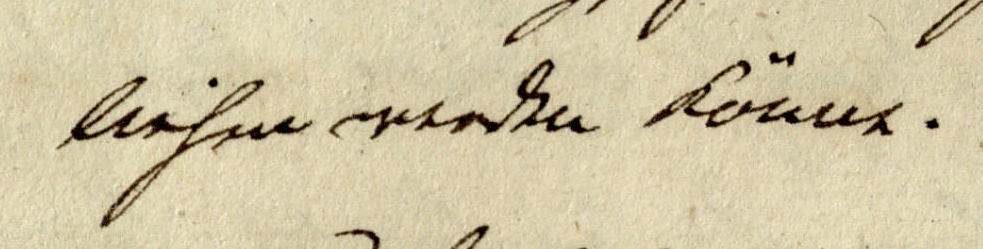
liehen werden könne.
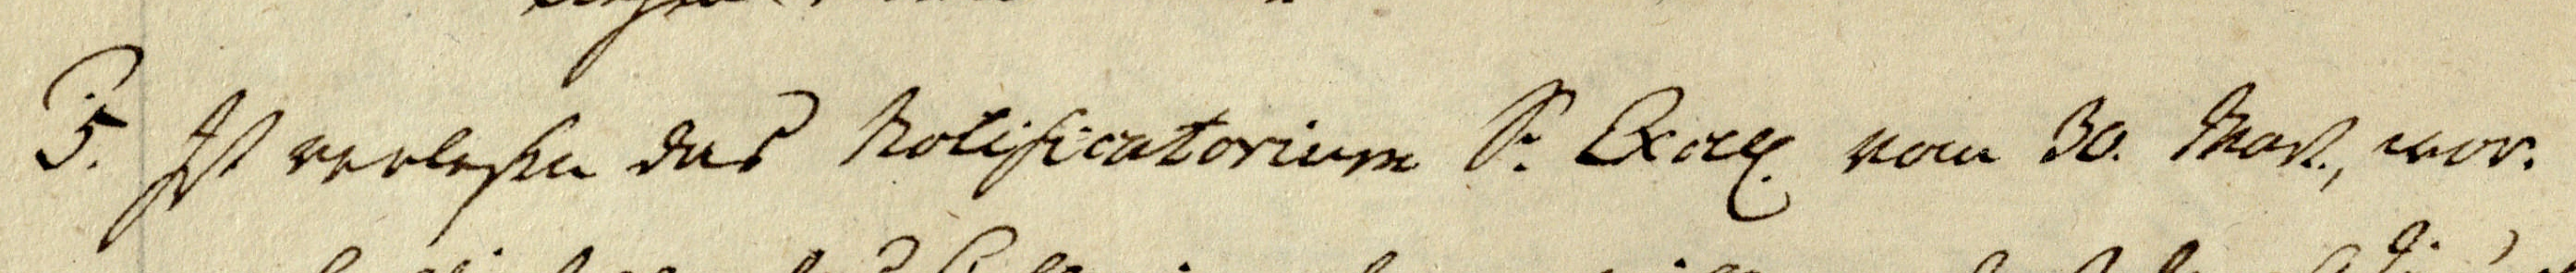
5. Ist verlesen das Notificatorium Sr. Excell. vom 30. Mart, wor¬
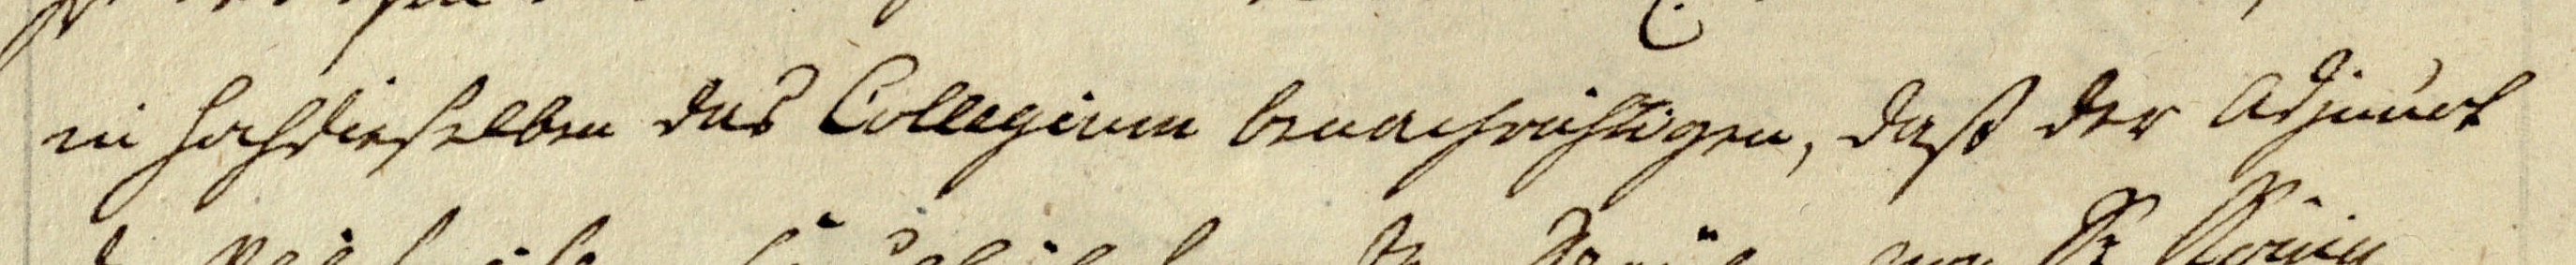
in Hochdieselben das Collegium benachrichtigen, daß der Adjunct
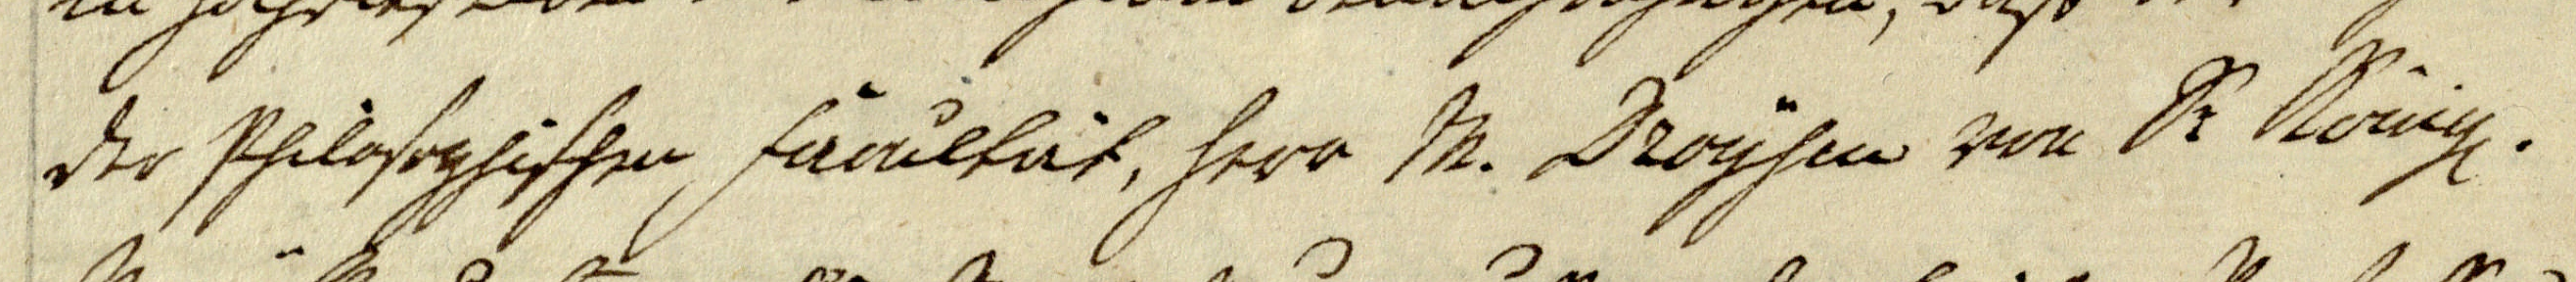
der Philosophischen Facultät, Herr M. Droÿsen von Sr. König.
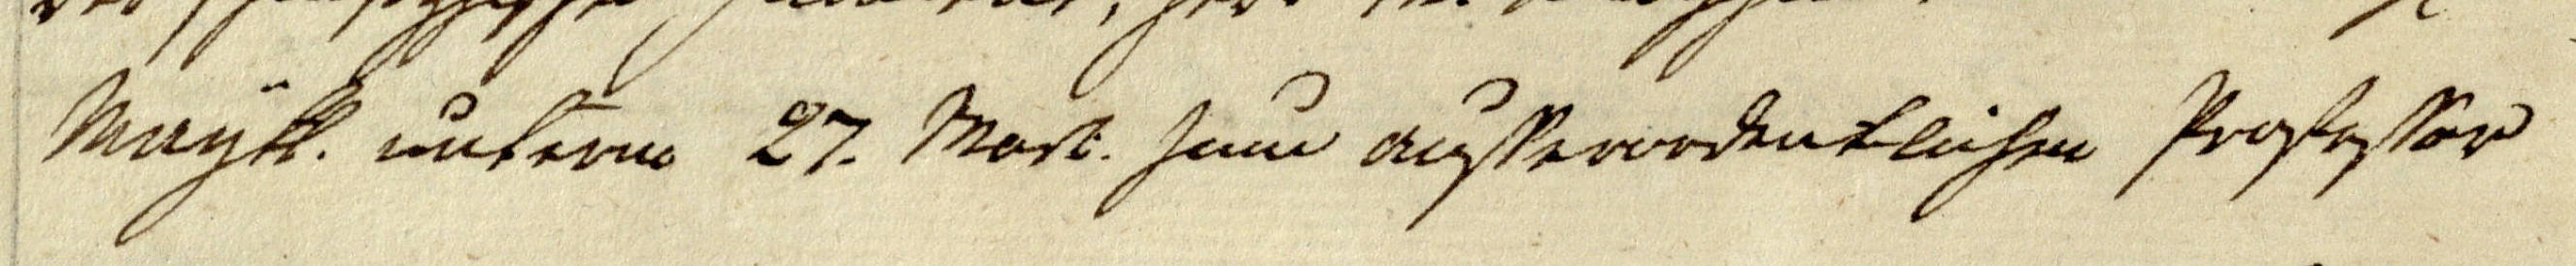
Maÿtt. unterm 27. Mart. zum ausserordentlichen Professor
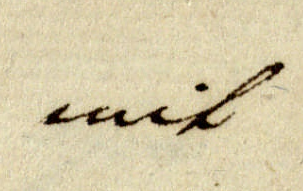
mit
